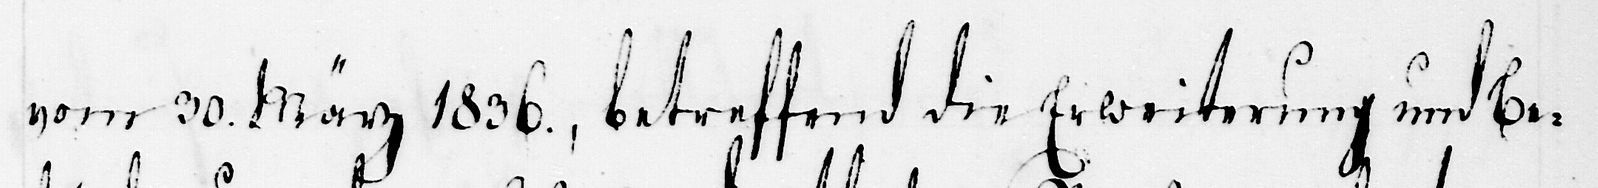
vom 30. März 1836., betreffend die Erweiterung und Be¬
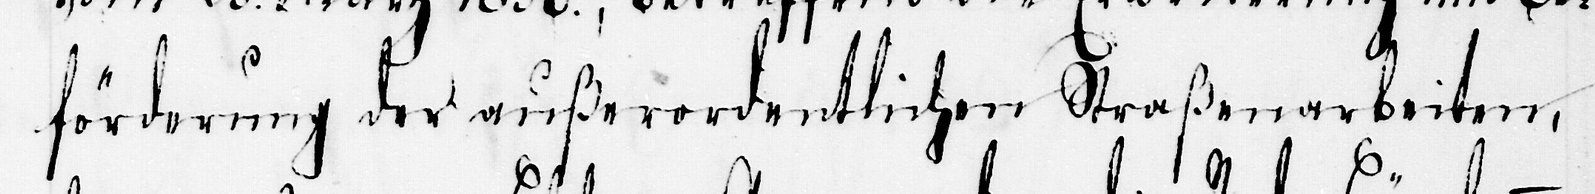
förderung der außerordentlichen Straßenarbeiten,
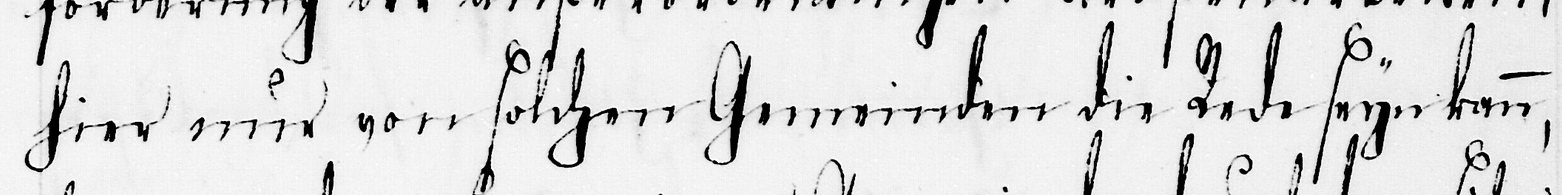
hier nur von solchen Gemeinden die Rede seyn
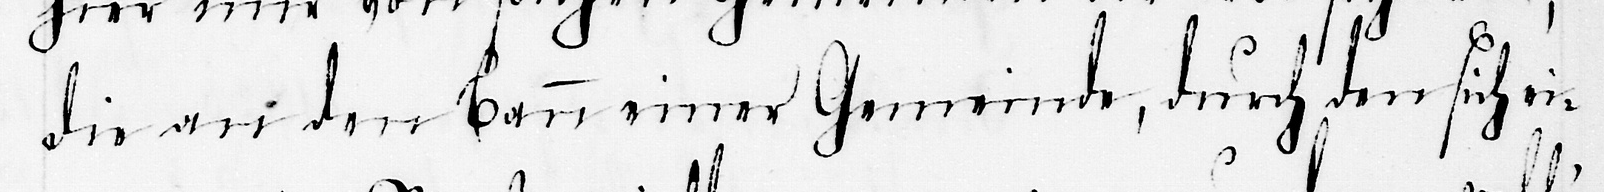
die an den Bau einer Gemeinde, durch den sich ei¬
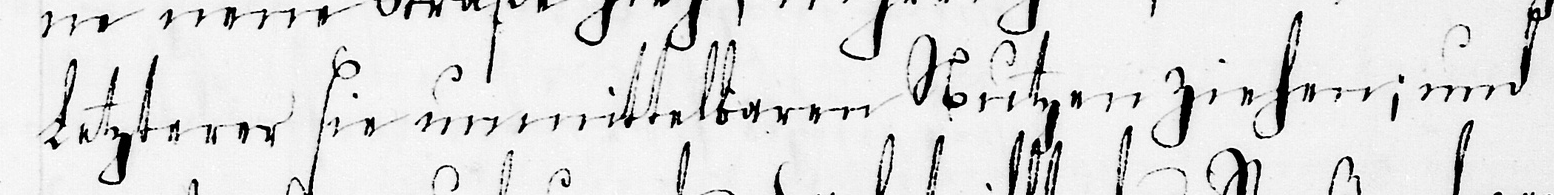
Letzterer sie unmittelbaren Nutzen ziehen; und
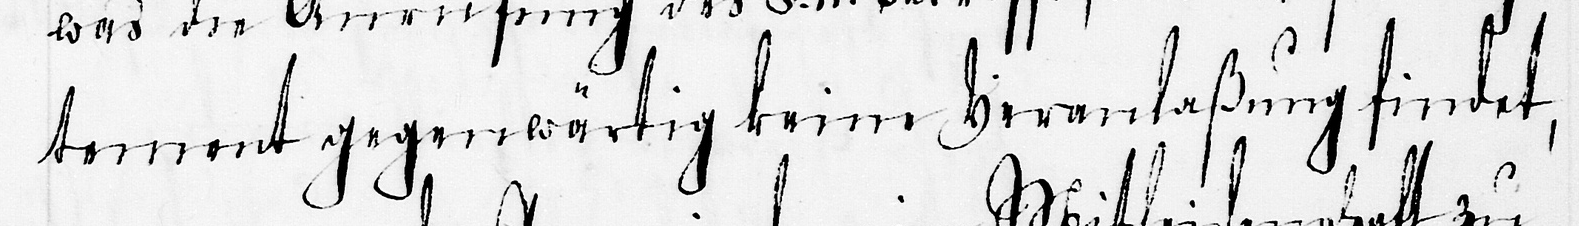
tement gegenwärtig keine Veranlaßung findet,
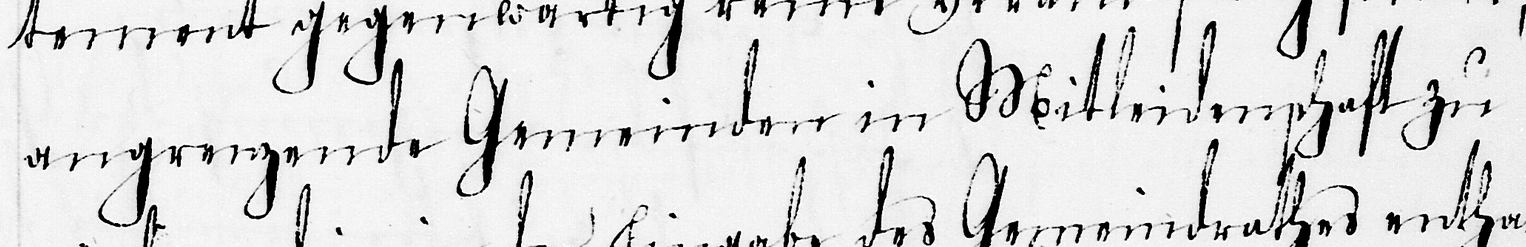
angrenzende Gemeinden in Mitleidenschaft zu
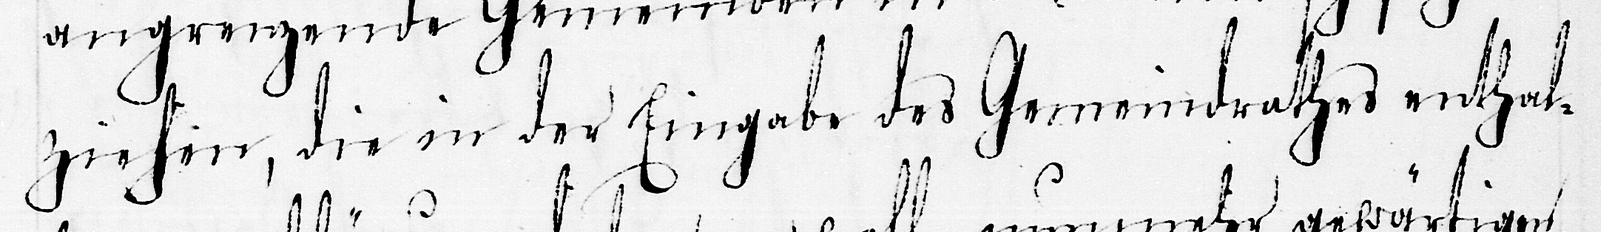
ziehen, die in der Eingabe des Gemeindrathes enthal¬
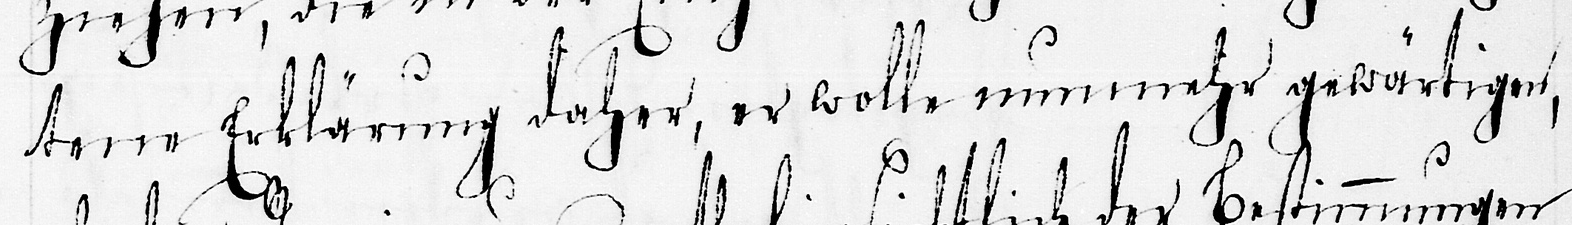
tene Erklärung daher, er solle nun mehr gewärtigen,
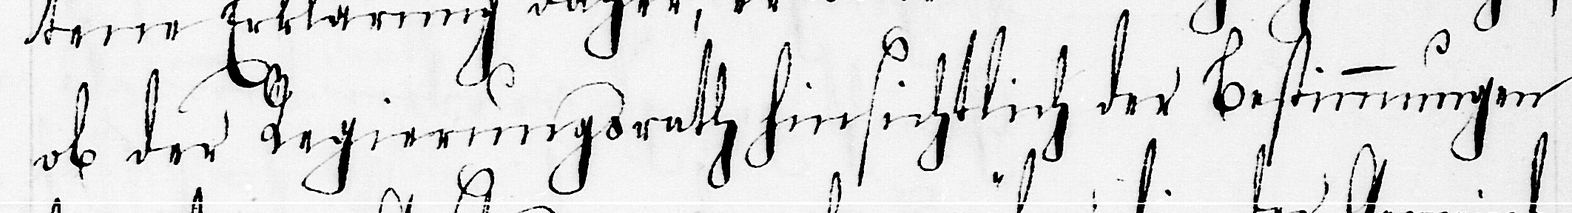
ob der Regierungsrath hinsichtlich der Bestimmungen
